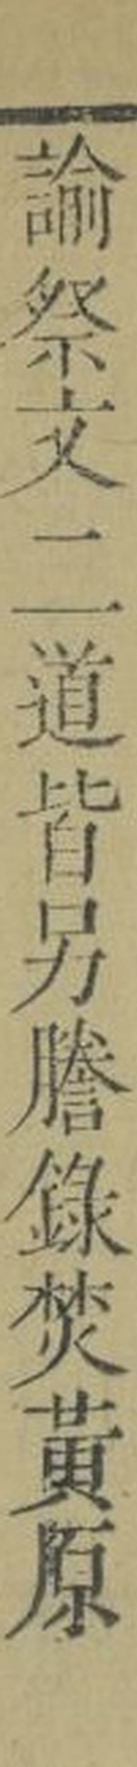諭祭文二道皆另謄錄焚黃原
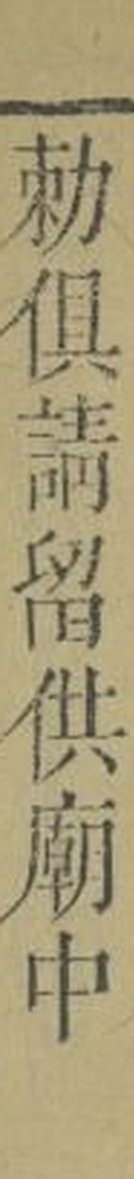勅俱請留供廟中
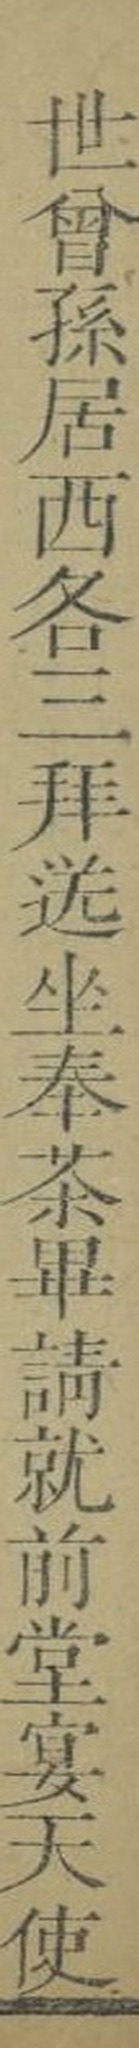世曾孫居西各三拜送坐奉茶畢請就前堂宴天使
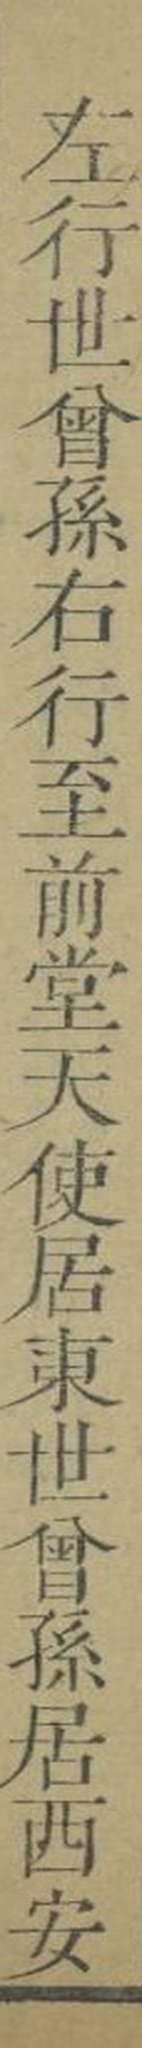左行世曾孫右行至前堂天使居東世曾孫居西安
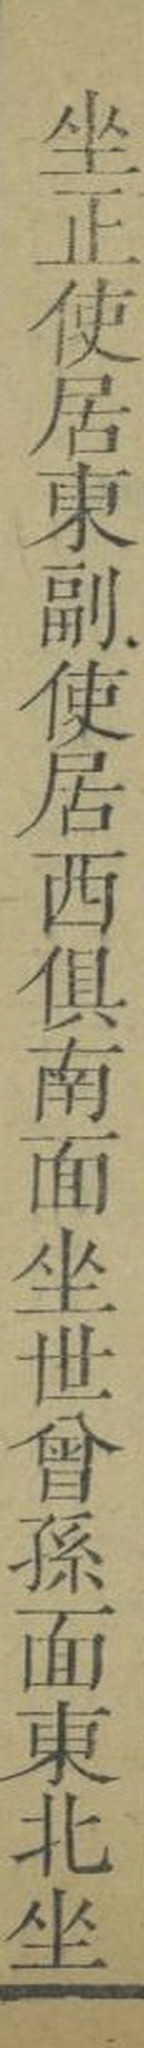坐正使居東副使居西俱南面坐世曾孫面東北坐
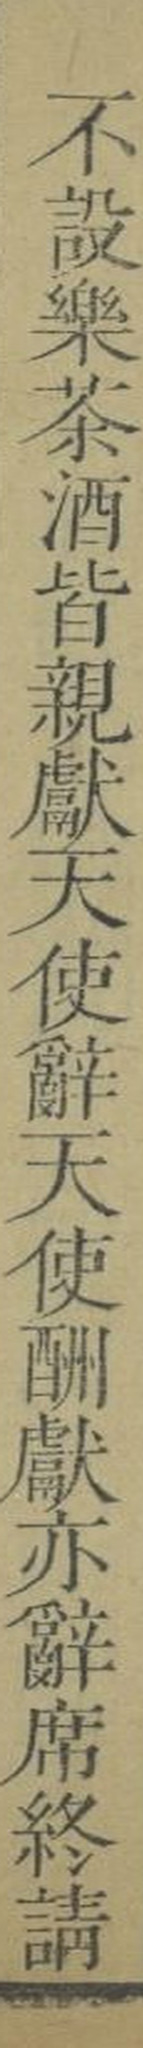不設樂茶酒皆親獻天使辭天使酬獻亦辭席終請
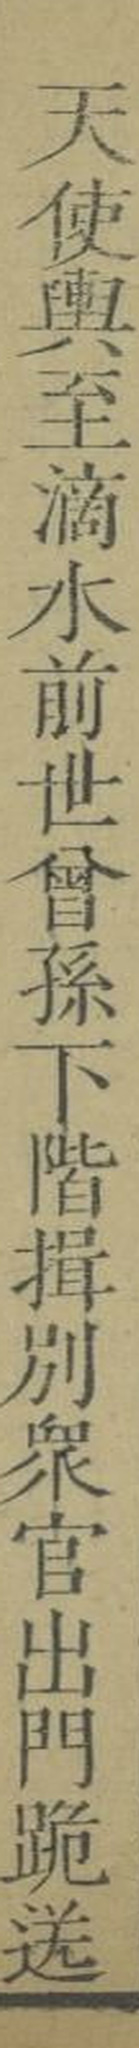天使輿至滴水前世曾孫下階揖別衆官出門跪送
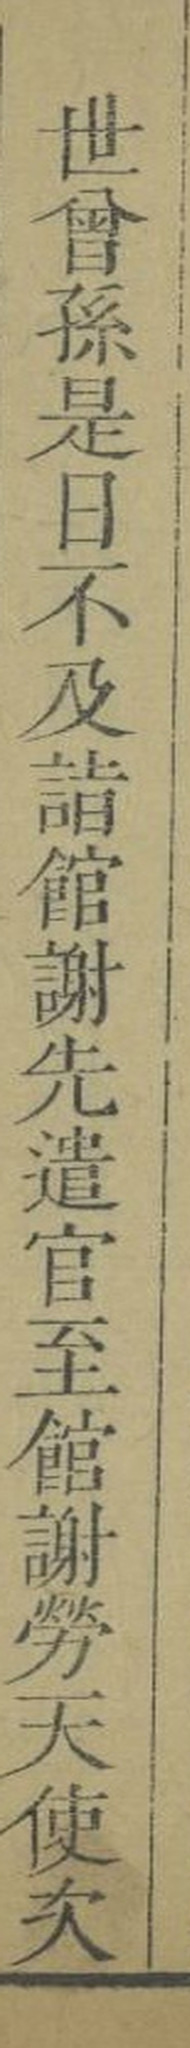世曾孫是日不及詣館謝先遣官至館謝勞天使次
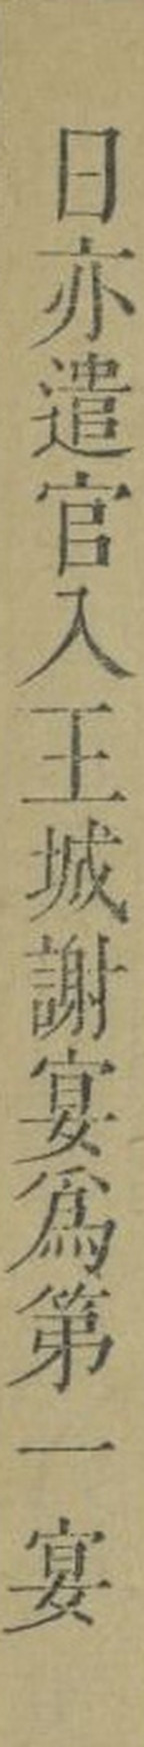日亦遣官入王城謝宴爲第一宴

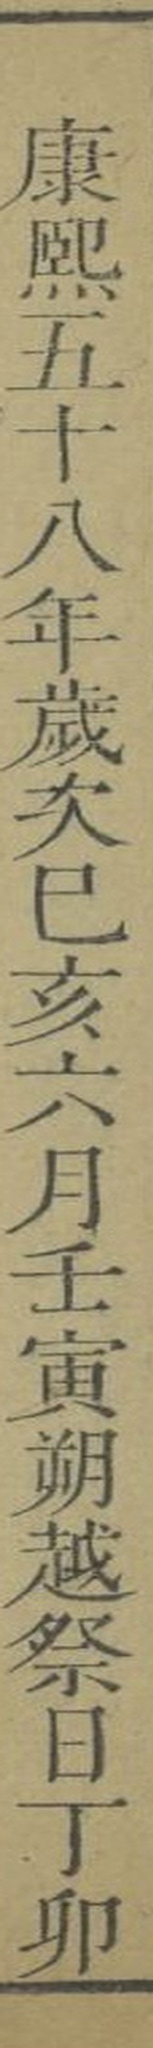康煕五十八年歲次巳亥六月壬寅朔越祭日丁卯
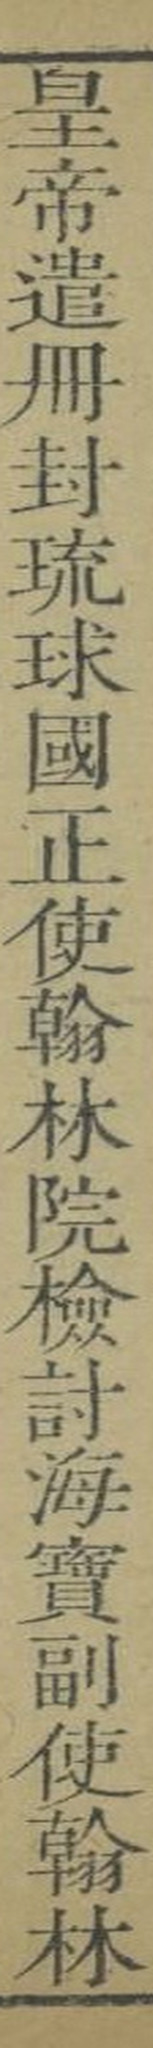皇帝遣冊封琉球國正使翰林院檢討海寶副使翰林
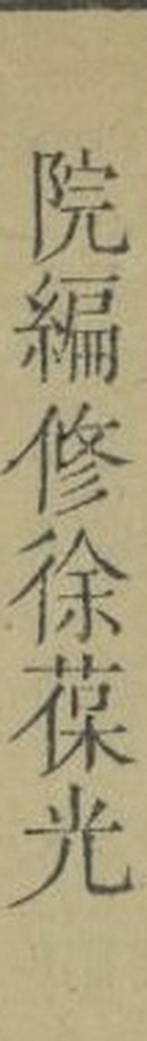院編修徐葆光
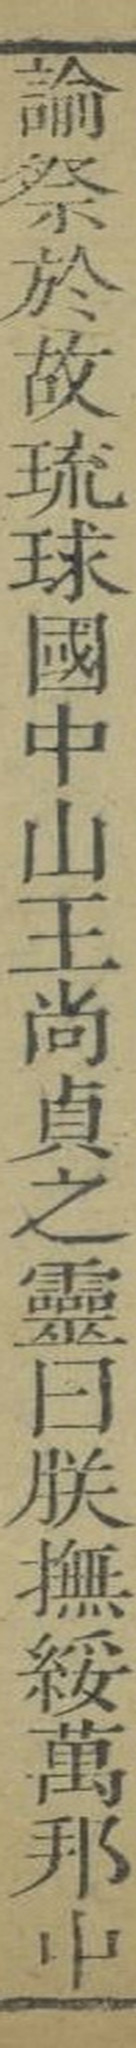諭祭於故琉球國中山王尚貞之靈曰朕撫綏萬邦中
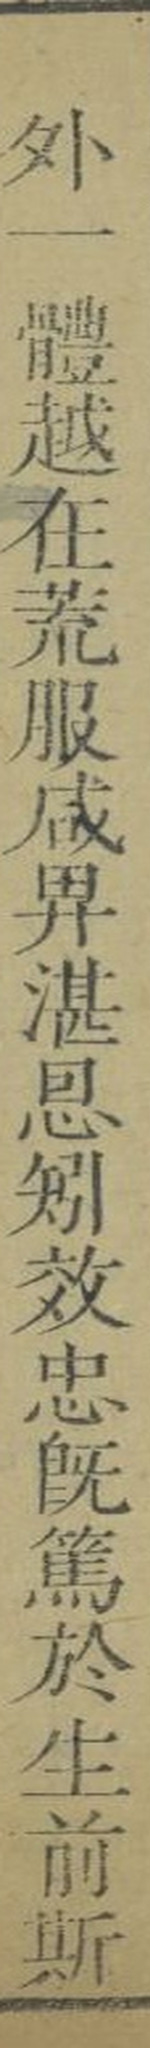外一體越在荒服咸畀湛㤙矧效忠既篤於生前斯
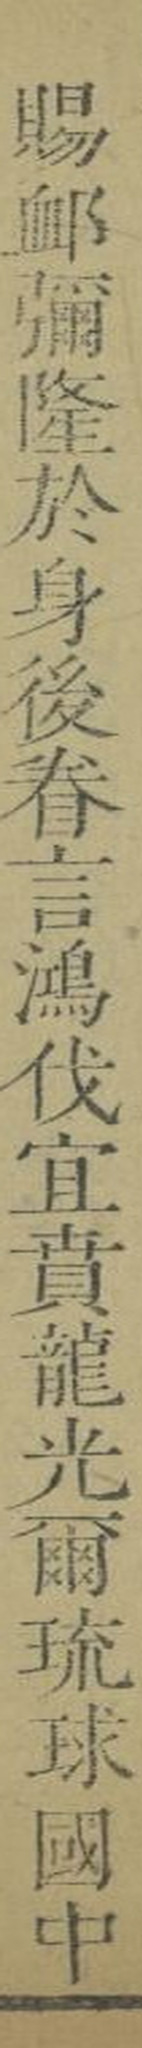賜䘏彌隆於身後眷言鴻伐宜賁龍光爾琉球國中
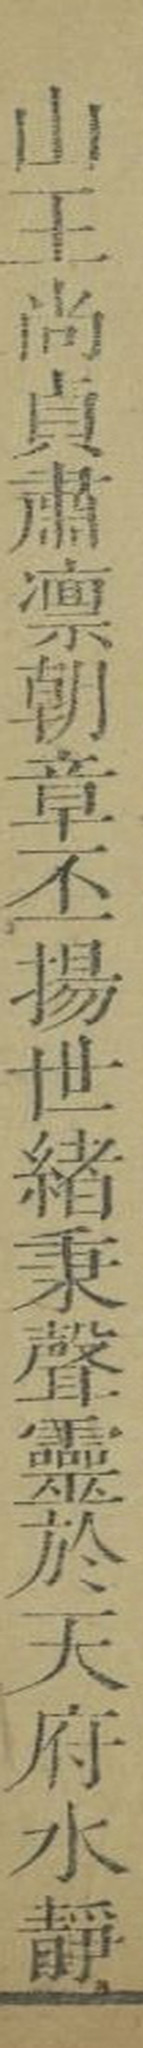山王尚貞肅凛朝章丕揚世緖秉聲靈於天府水靜
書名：中山伝信録 巻二
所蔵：University of the Ryukyus Library
